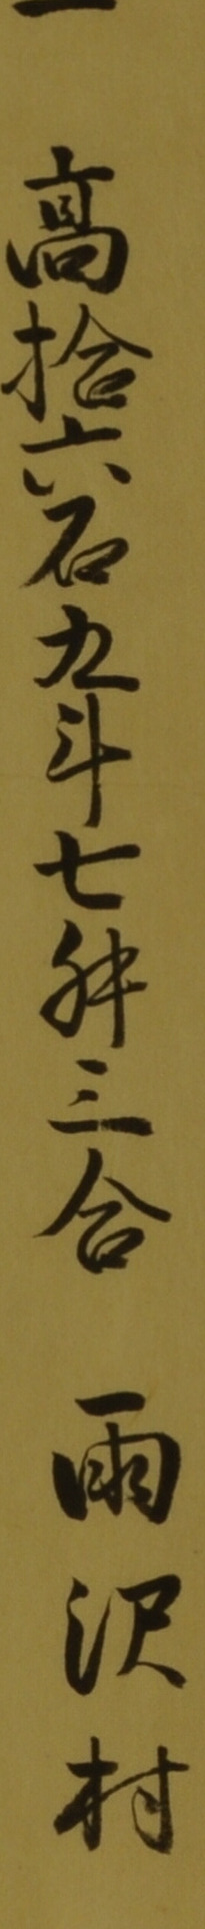一高拾六石九斗七升三合雨沢村
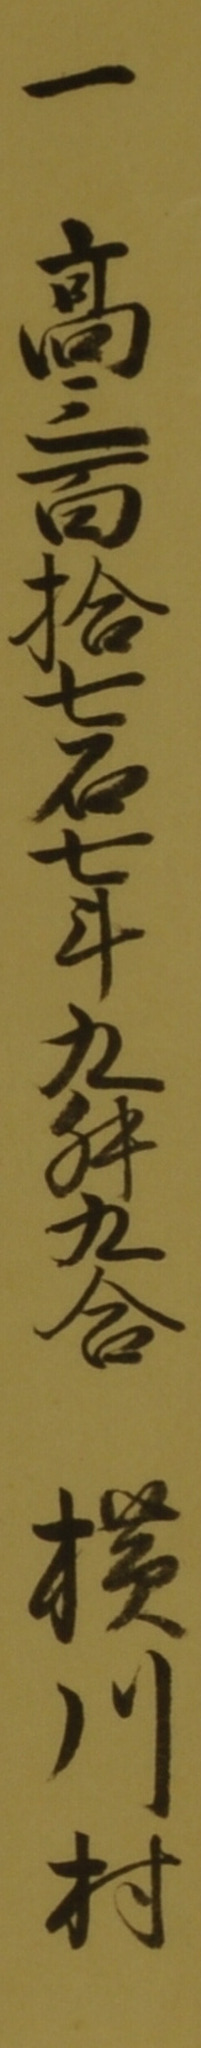一高三百拾七石七斗九升九合横川村
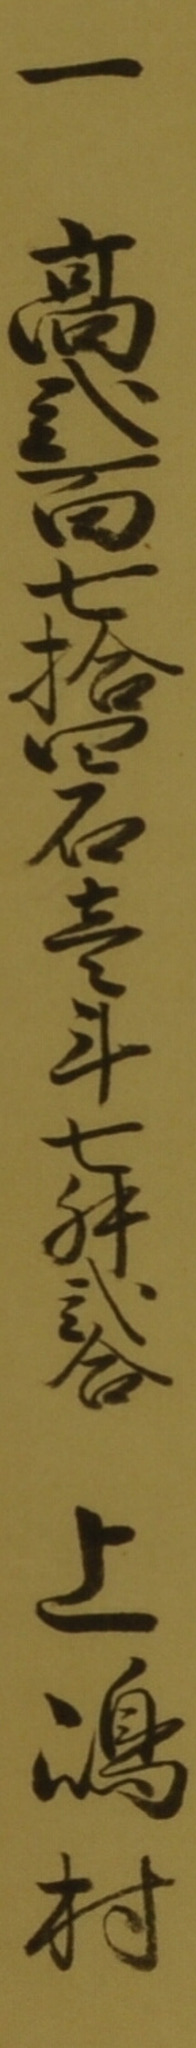一高弐百七拾四石壱斗七升弐合上島村
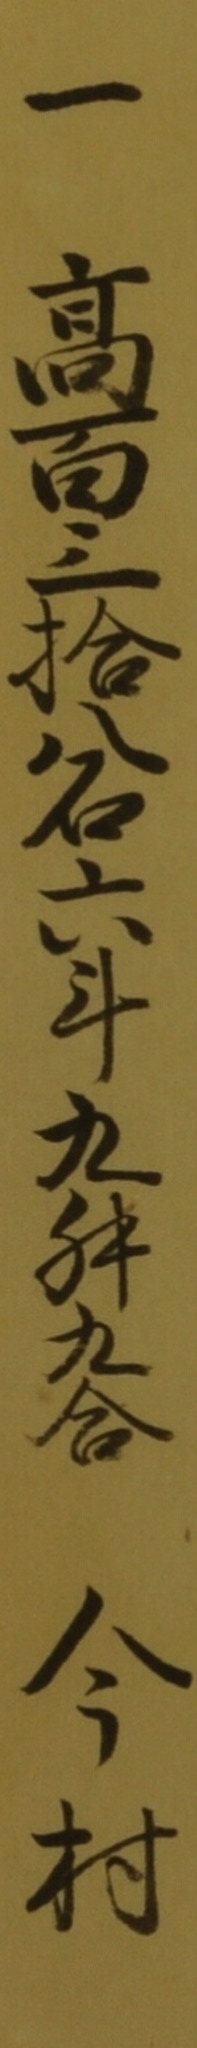一高百三拾八石六斗九升九合今村
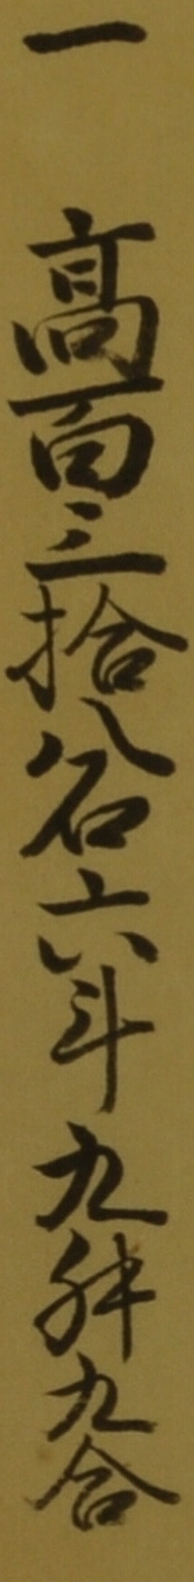一高百三拾八石六斗九升九合今村

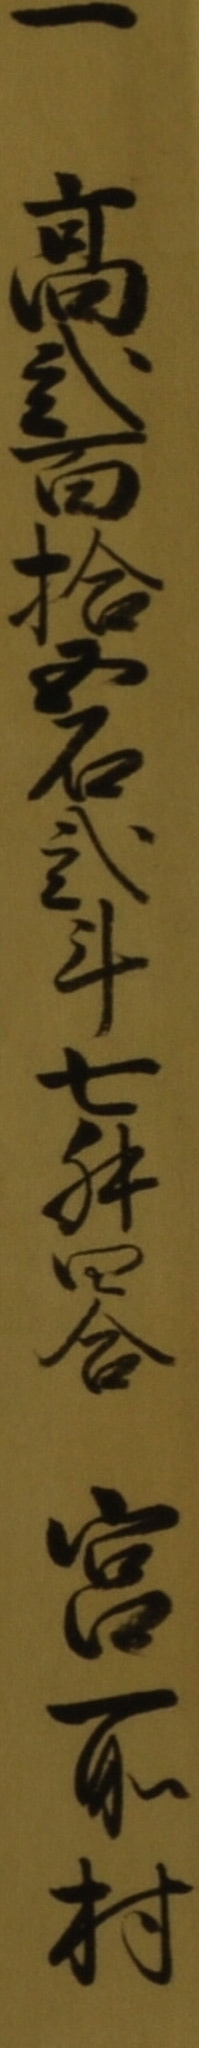一高弐百拾五石弐斗七升四合宮所村
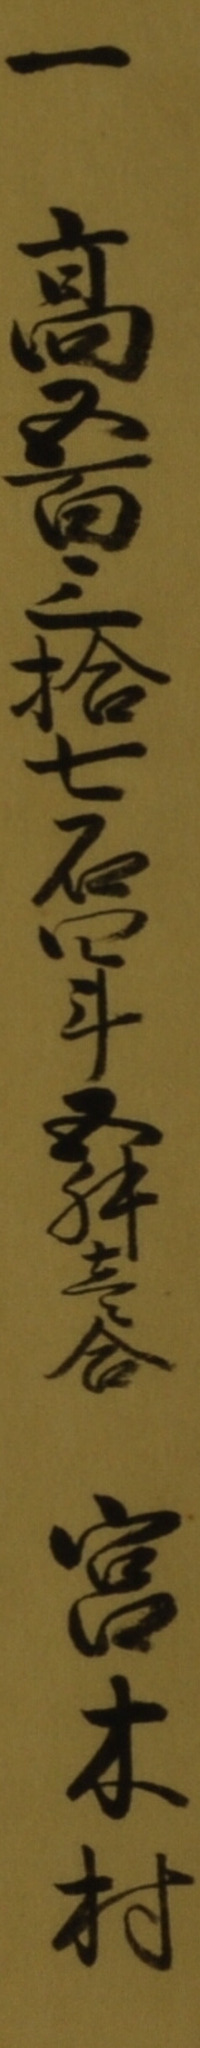一高五百三拾七石四斗五升壱合宮木村
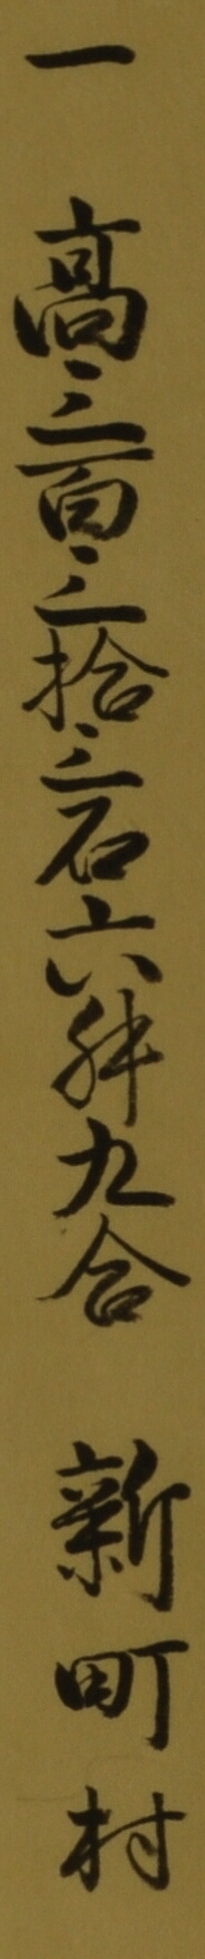一高三百三拾三石六升九合新町村
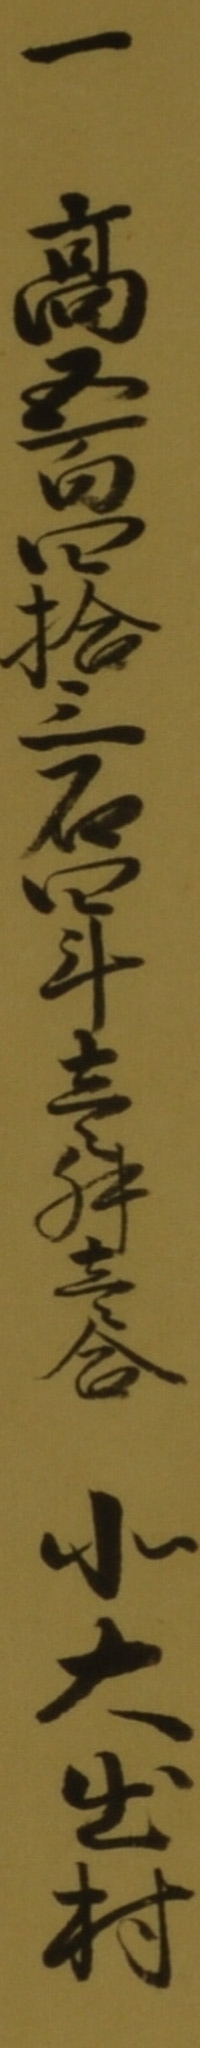一高五百四拾三石四斗壱升壱合北大出村
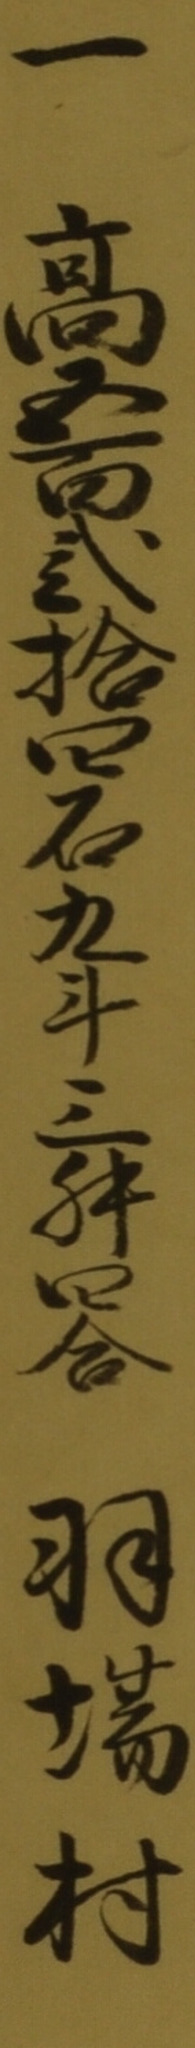一高五百弐拾四石九斗三升四合羽場村
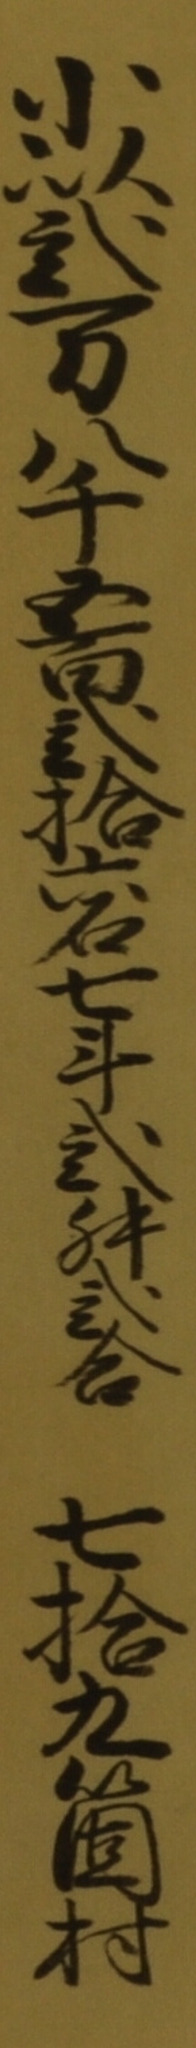小以弐万八千五百弐拾六石七斗弐升弐合七拾九箇村

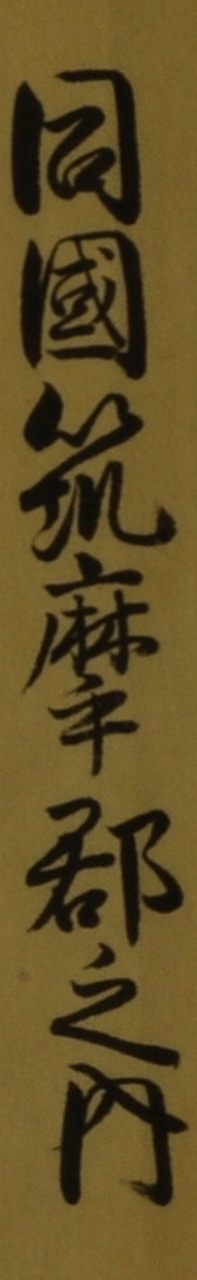同国筑摩郡之内
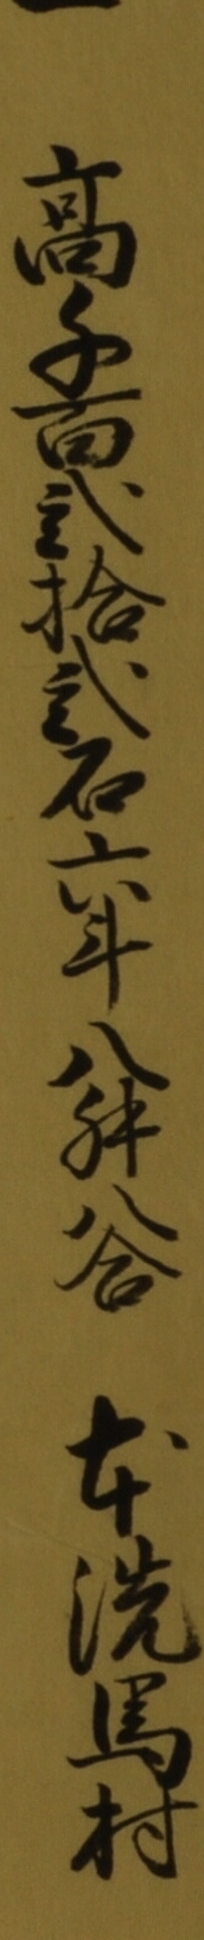一高千百弐拾弐石六斗八升八合本洗馬村
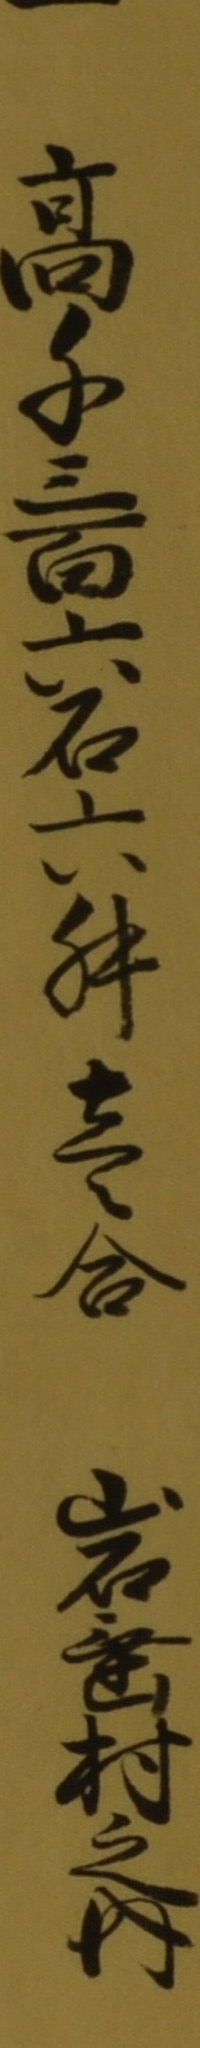一高千三百六石六升壱合岩垂村之内
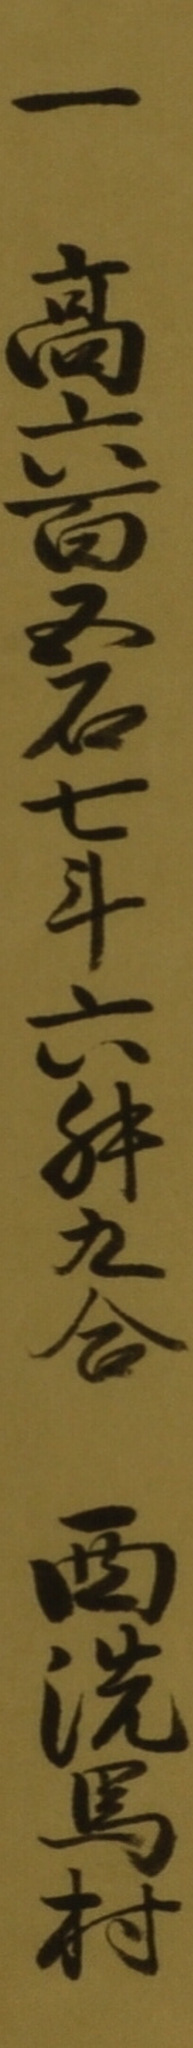一高六百五石七斗六升九合西洗馬村
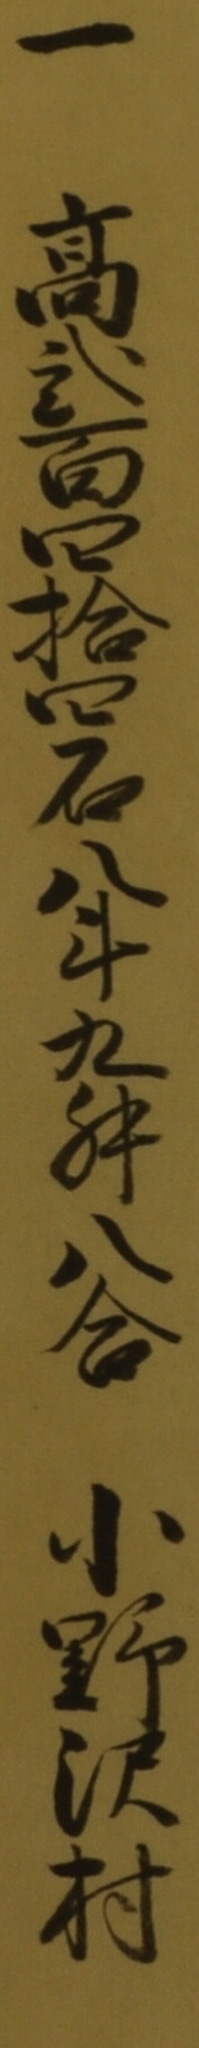一高弐百四拾四石八斗九升八合小野沢村
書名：信濃国伊那郡筑摩郡高遠領知郷村高辻帳
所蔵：伊那市立高遠町図書館・合同会社AMANE
